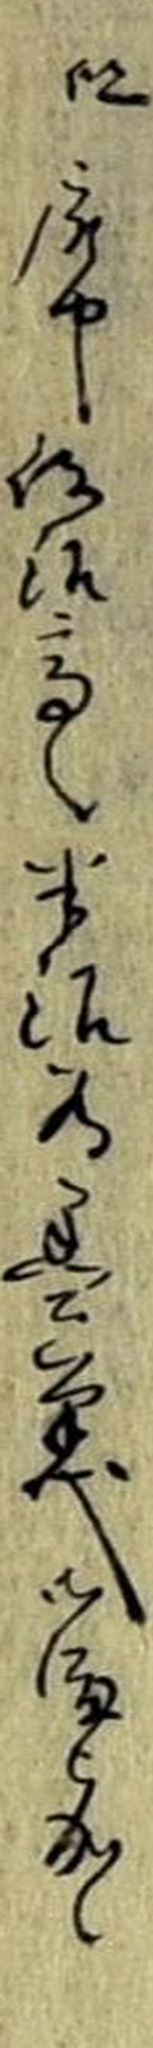但府中役銀高之半銀為墨筆代御渡被成候
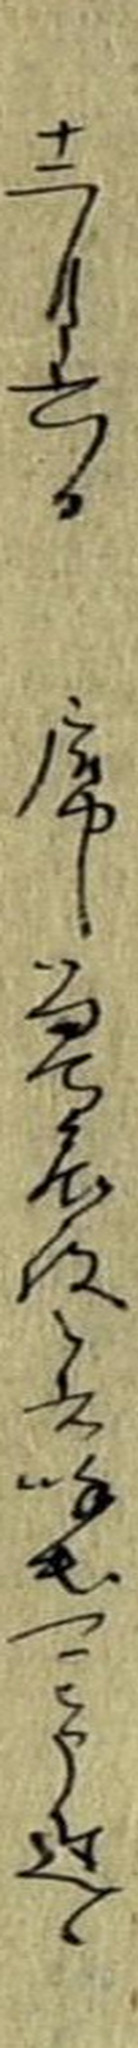十二月六日府中留守居役之者呼出可被申達候

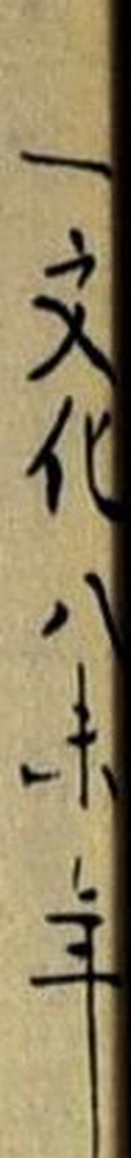一文化八未年
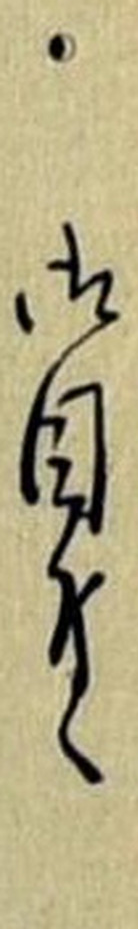御目付へ
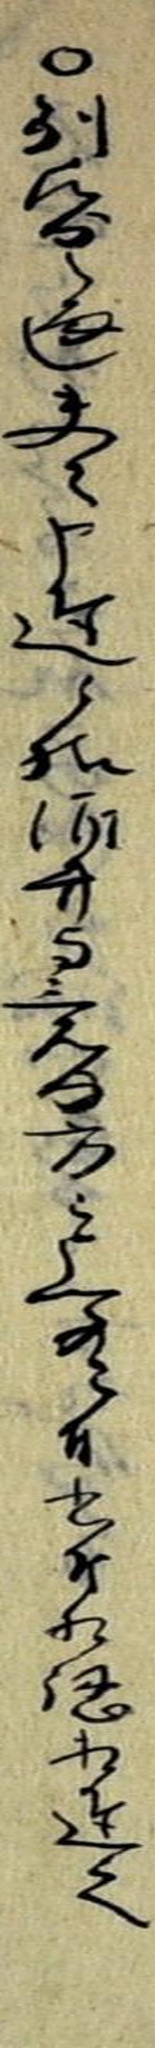○別紙之通夫々申達候様酒井与三左衛門方被申聞候に付書付相認相達之
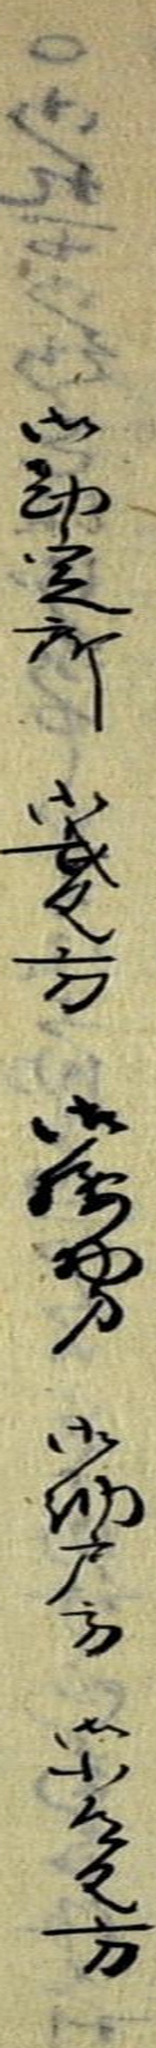御勘定所御武具方御腰物方御納戸方御小道具方
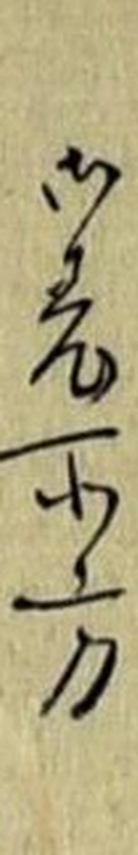御台所方
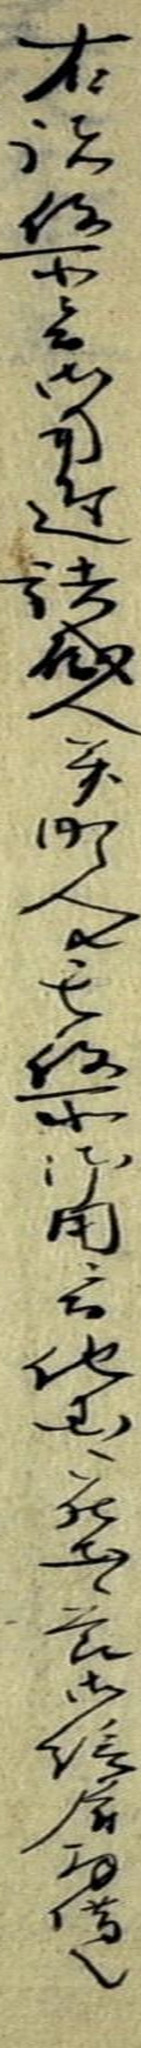右諸役所に而御用達諸職人并町人共其役所御用に而他国へ罷出候節御絵符拝借之
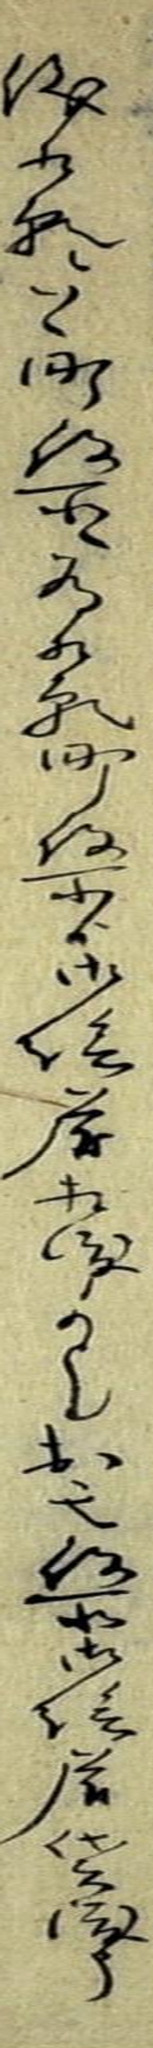儀相願候はヽ町役所へ為相願町役所ゟ御絵符相渡し可申候於其役所御絵符貸渡申
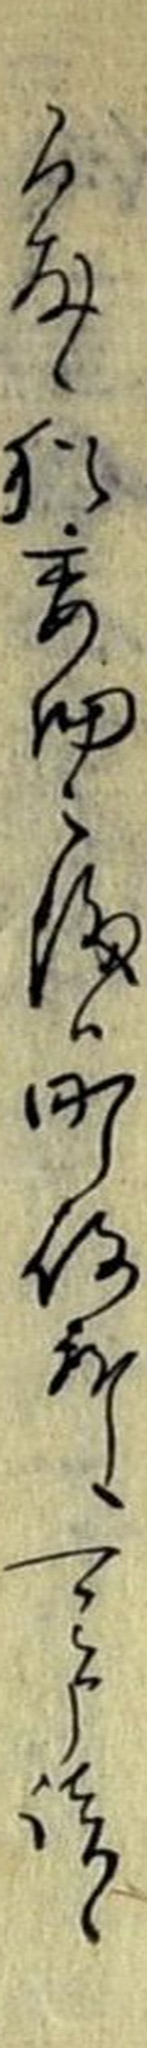間敷候猶委細之儀は町役所へ可被申談候
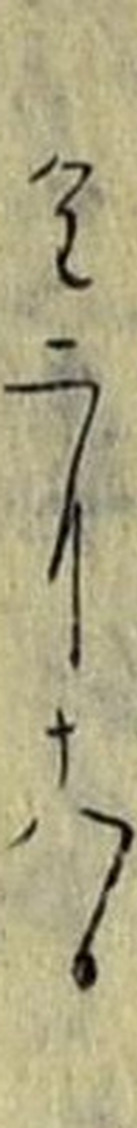閏二月十八日
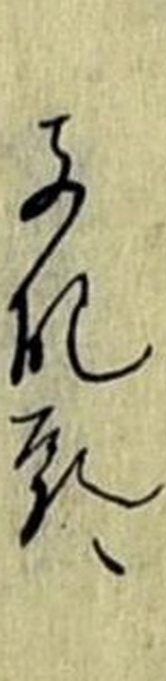支配頭へ
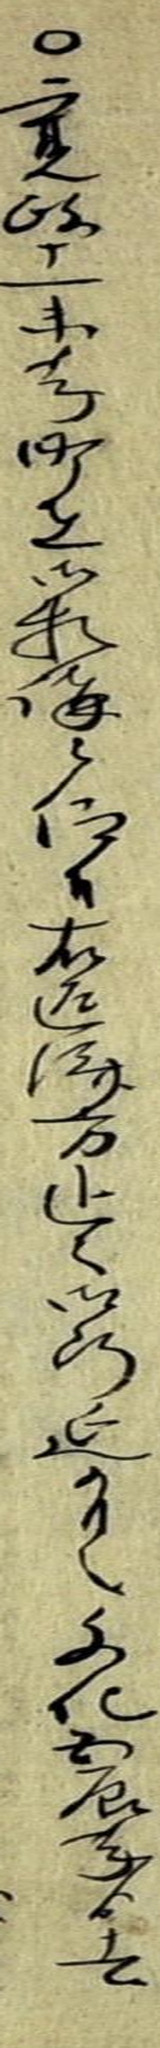○寛政十一未年町在御頼講被仰付右返済方追々御断延有之文化五辰年ゟ去
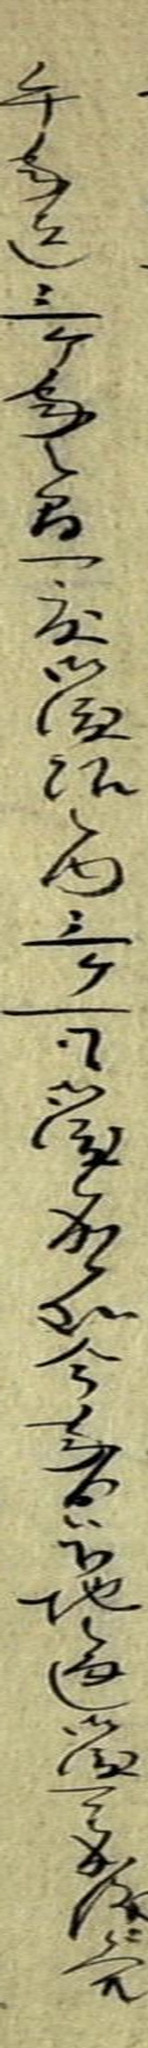午年迄三ヶ年之間一度御渡銀之内三ヶ一つヽ御渡被成候処今年ゟは下地之通御渡可被成儀に候へ共
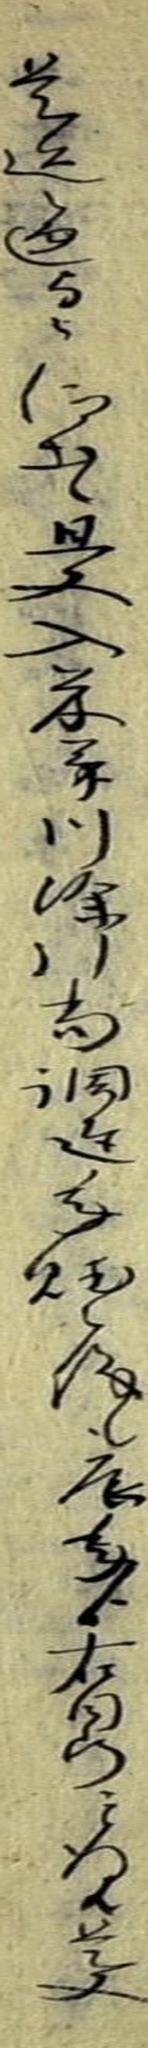是迄之通と被仰出候且又入米并川除引当調達年賦之儀も辰年ゟ右同断に候得共是又
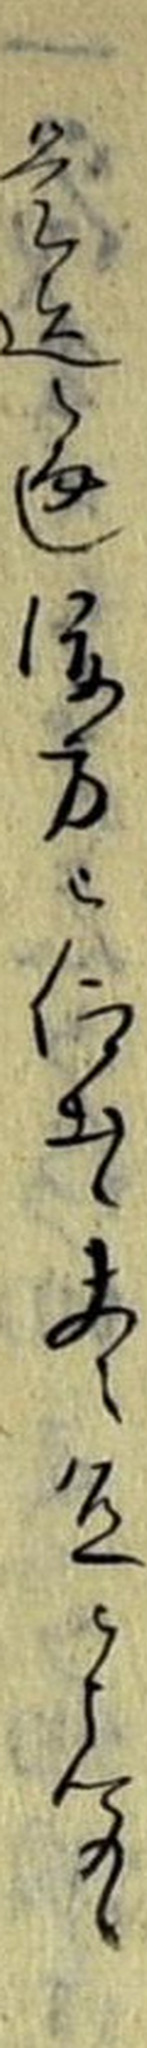是迄之通渡方被仰出候夫々宜被申聞候
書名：命令之部 四
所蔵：福井県文書館 Fukui Prefectural Archives
